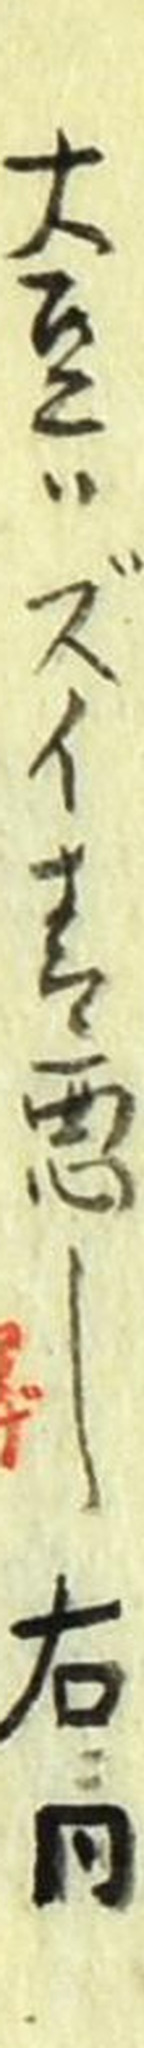大豆ハズイ青悪し右ニ同
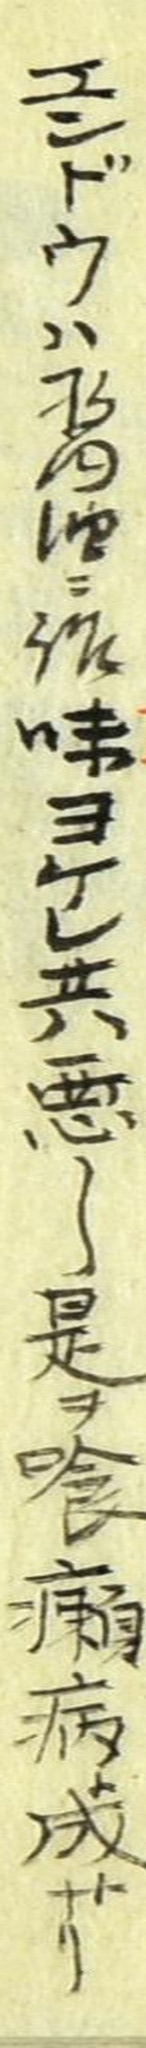エンドウハ醤油ニ作味ヨケレ共悪し是ヲ喰癩病ト成トナリ

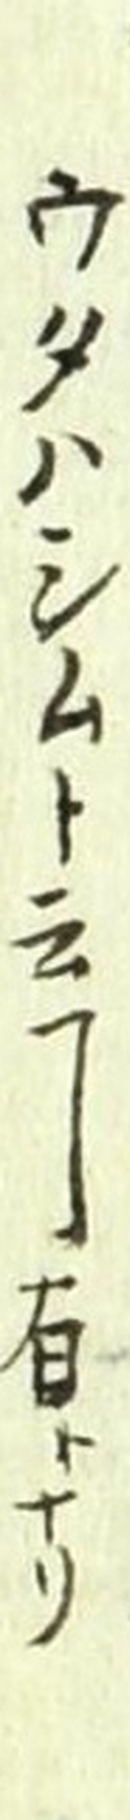ウタハシムト云コト有トナリ
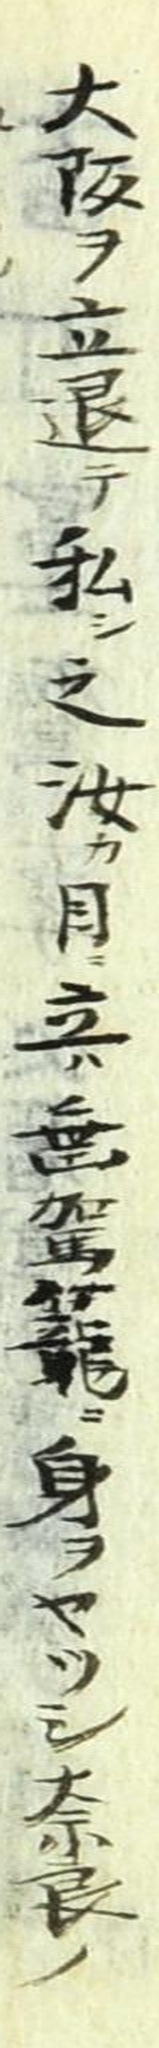大阪ヲ立退テ私シ之汝カ目ニ立ハ乗駕籠ニ身ヲヤツシ奈良ノ
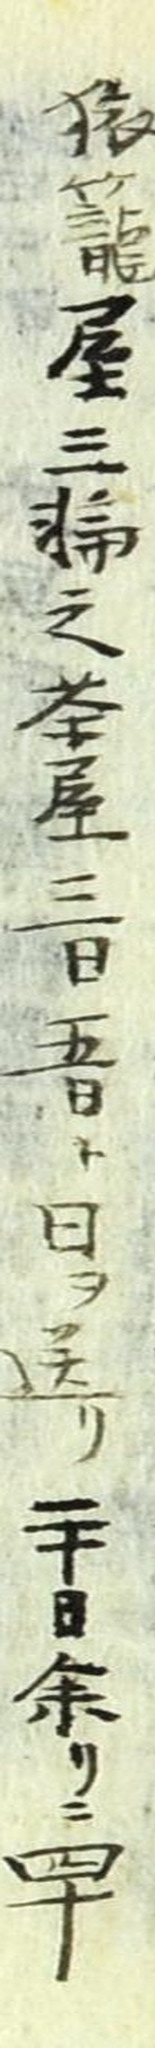旅籠屋三輪之茶屋三日五日ト日ヲ送リ二十日余リニ四十
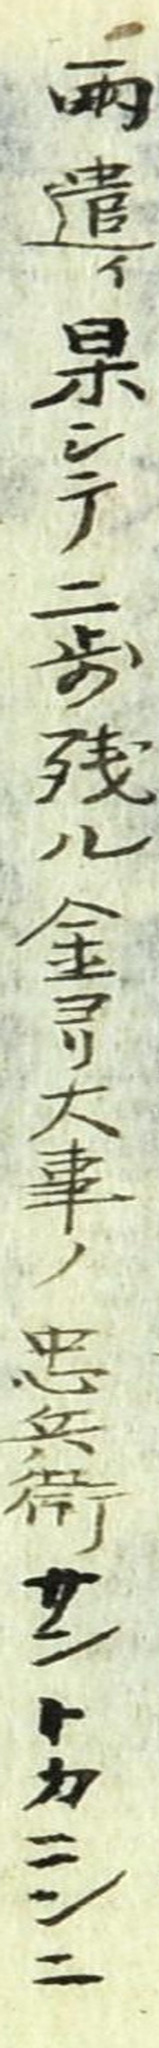両遣イ果シテ二歩残ル金ヨリ大事ノ忠兵衛サントカニンニ
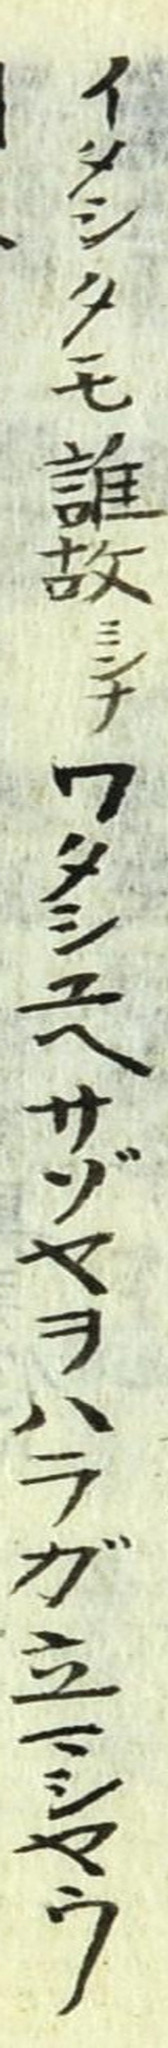イタシタモ誰故ミンナワタシユヘサゾヤヲハラガ立マシヤウ
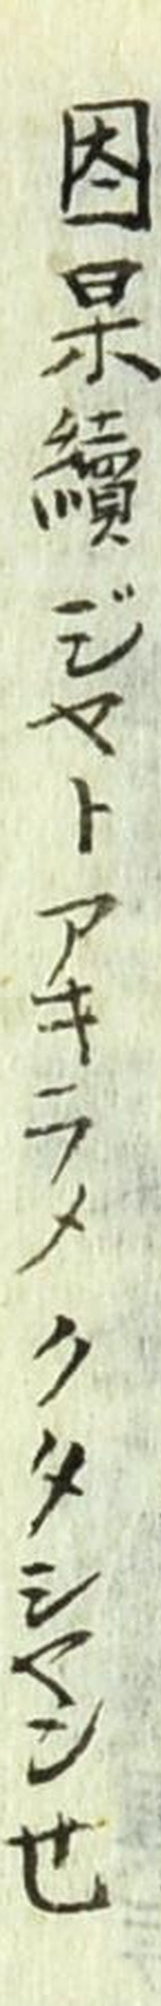因果続ジヤトアキラメクタシヤンセ
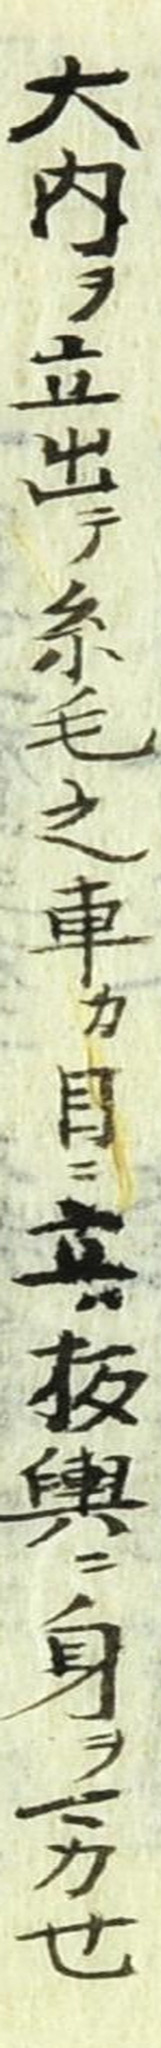大内ヲ立出テ糸毛之車カ目ニ立ハ板輿ニ身ヲマカセ
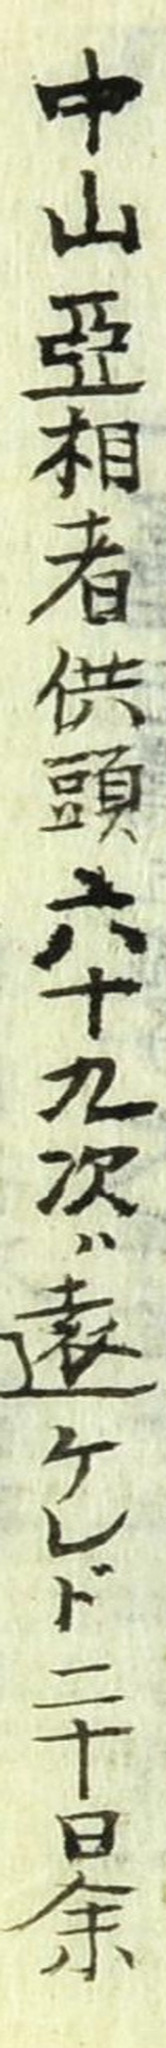中山亜相者供頭六十九次ハ遠ケレド二十日余
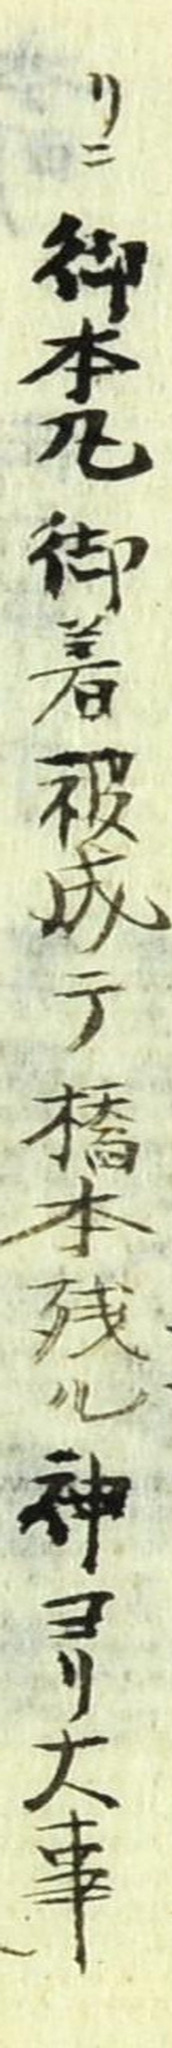リニ御本丸御着被成テ橋本残ル神ヨリ大事
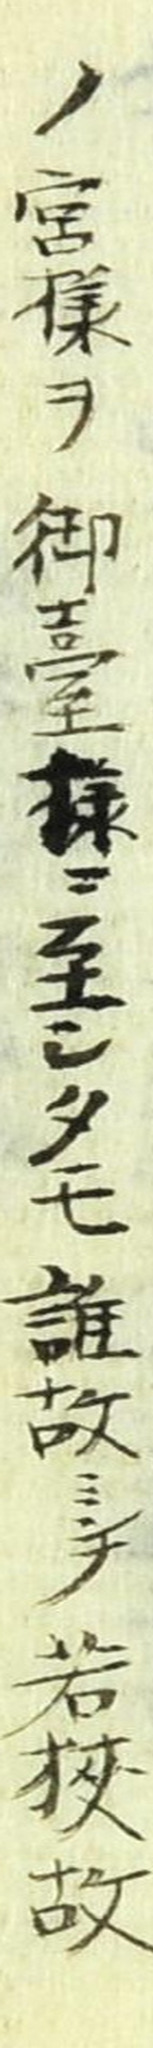ノ宮様ヲ御台様ニ至シタシタモミンナ若狭故
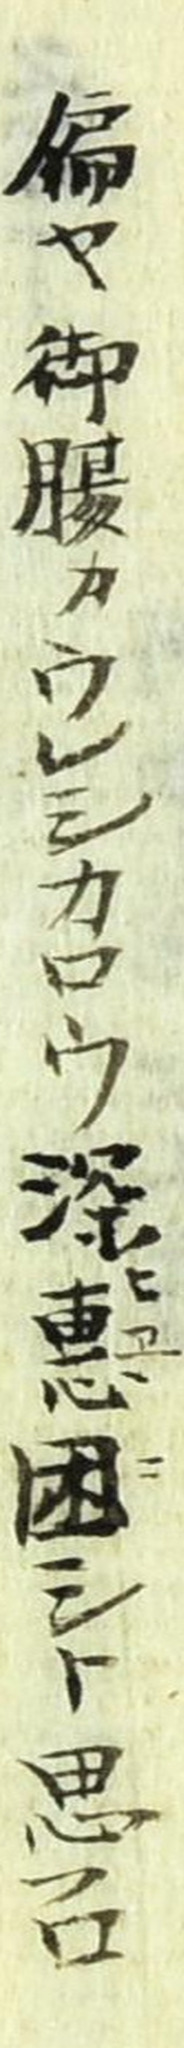偏ヤ御腹カウレシカロウ深ヒ恵困シト思召

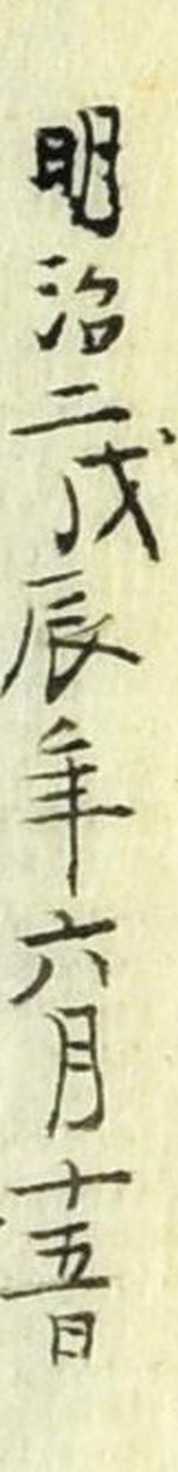明治二戊辰年六月十五日
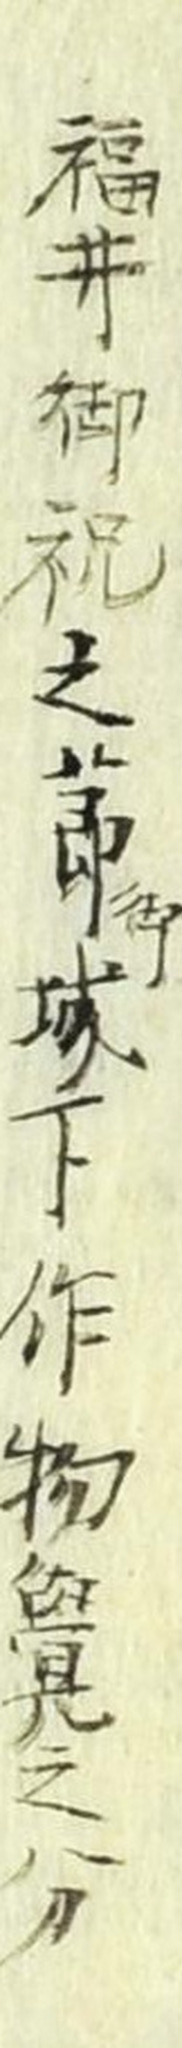福井御祝之節御城下作物覚之分
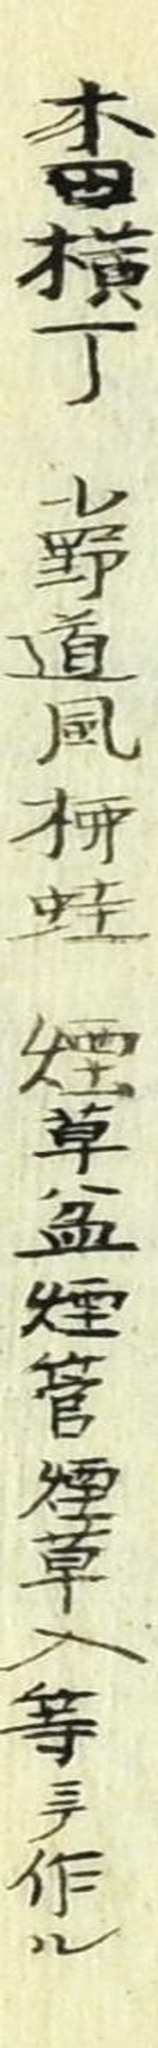木田横丁小野東風柳蛙煙草盆煙管煙草入等ニテ作ル
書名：（日記）
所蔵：福井県文書館 Fukui Prefectural Archives
